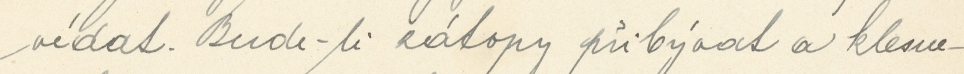vídat. Bude-li zátopy přibývat a klesne-
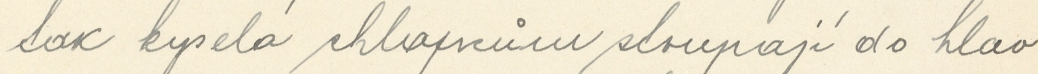tak kyselá chlapcům stoupají do hlav
